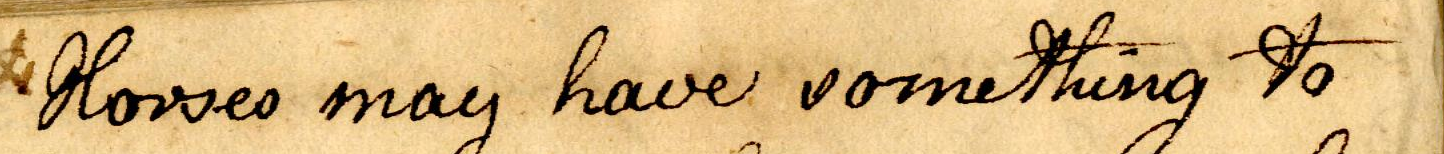Horses may have something to
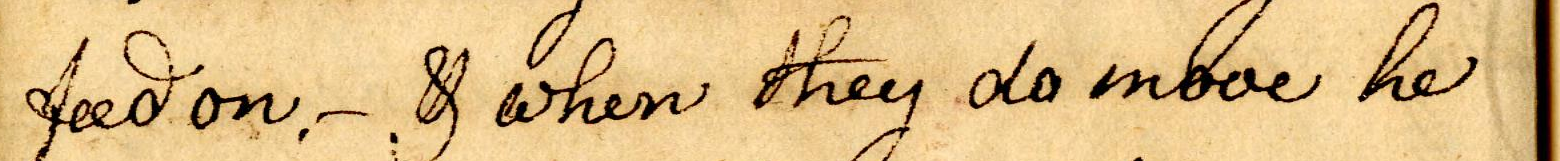feed on.- & when they do move he
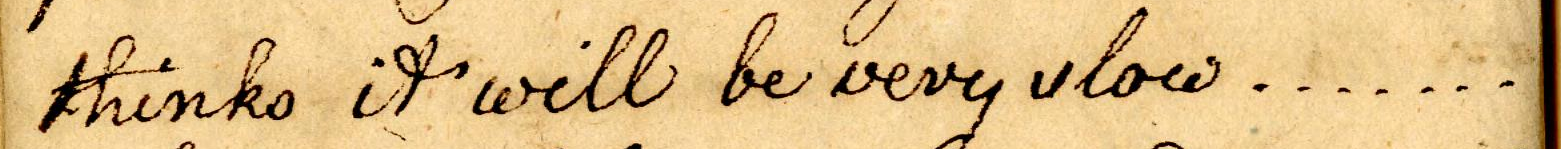thinks it will be very slow.......
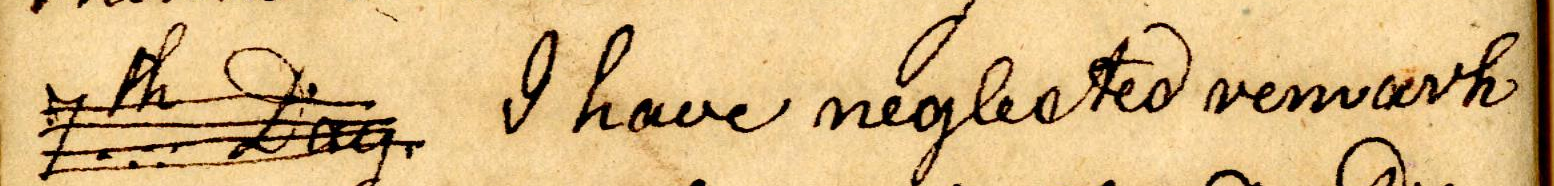[7^th. Day.] I have neglected remark
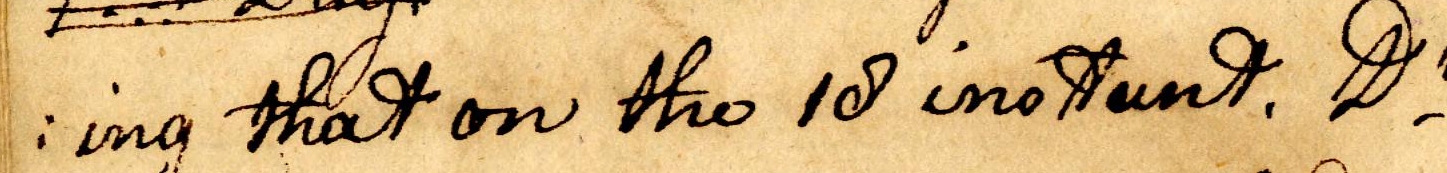-ing that on the 18 instant. D^r
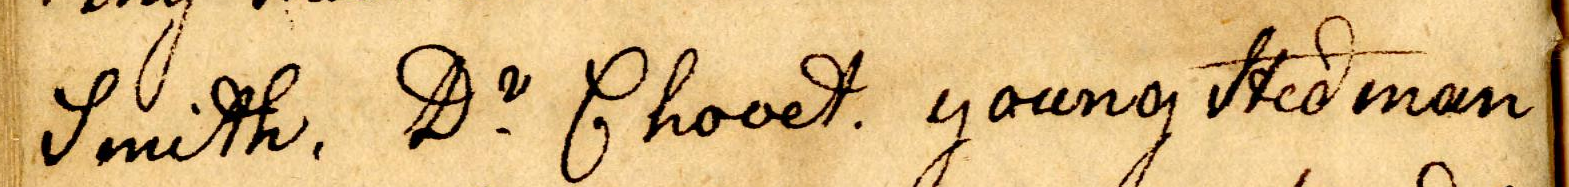Smith, D^r Chovet. young Stedman
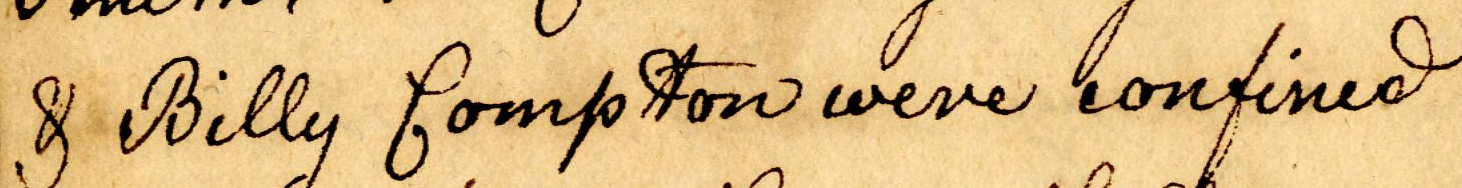& Billy Compton were confined
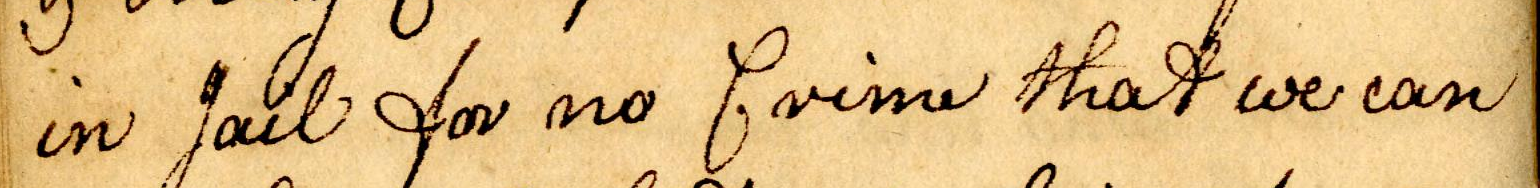in Jail for no Crime that we can
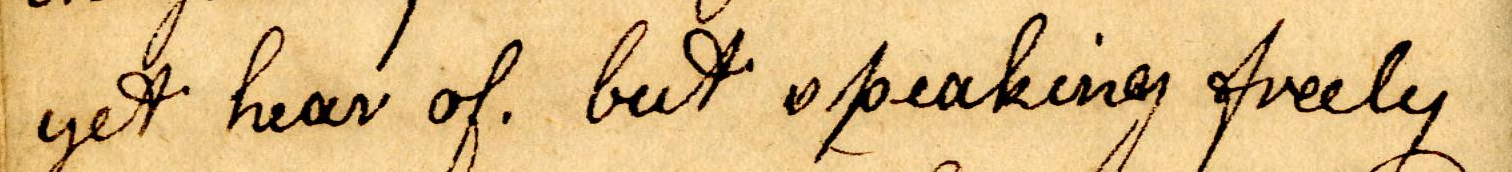yet hear of. but speaking freely
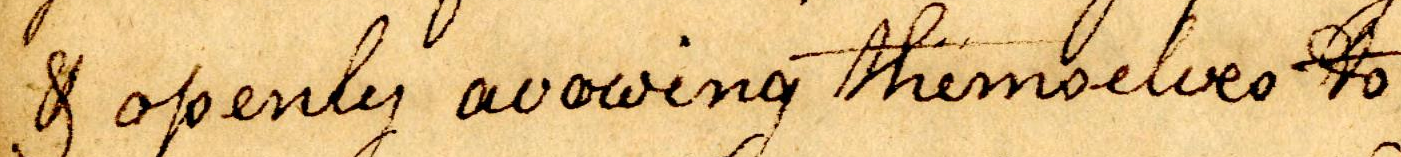& openly avowing themselves to
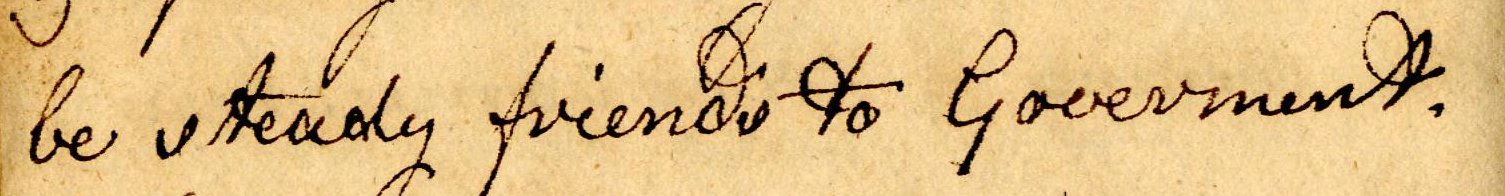be steady friends to Government.
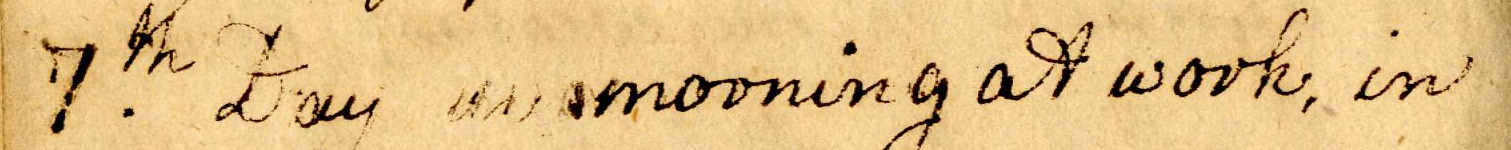7^th Day morning at work, in
